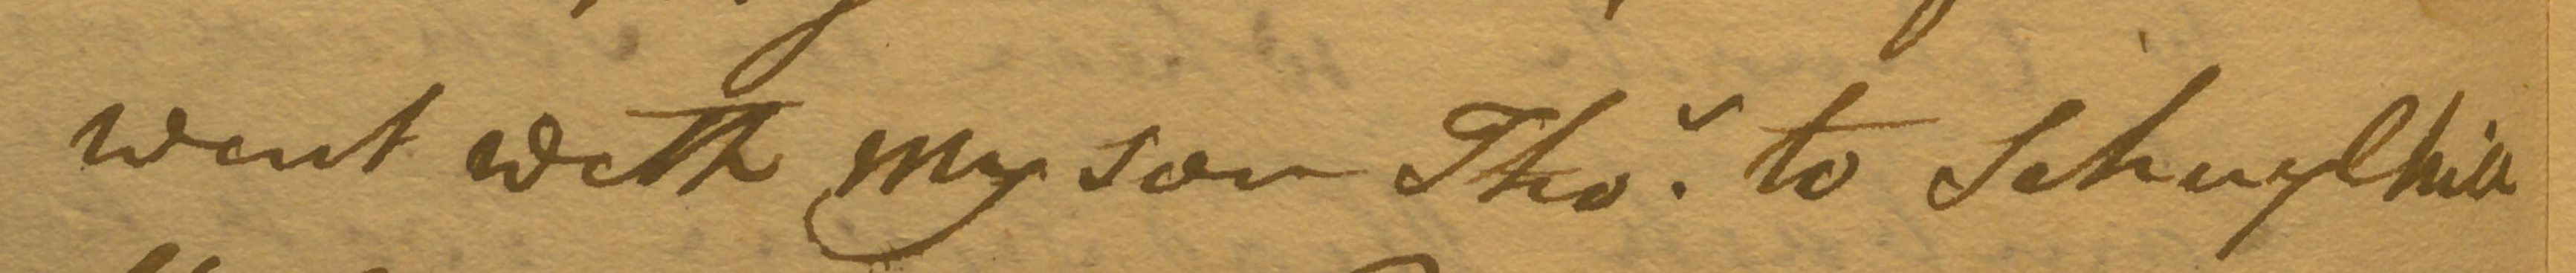went with my son Tho^s. to Schuylkill
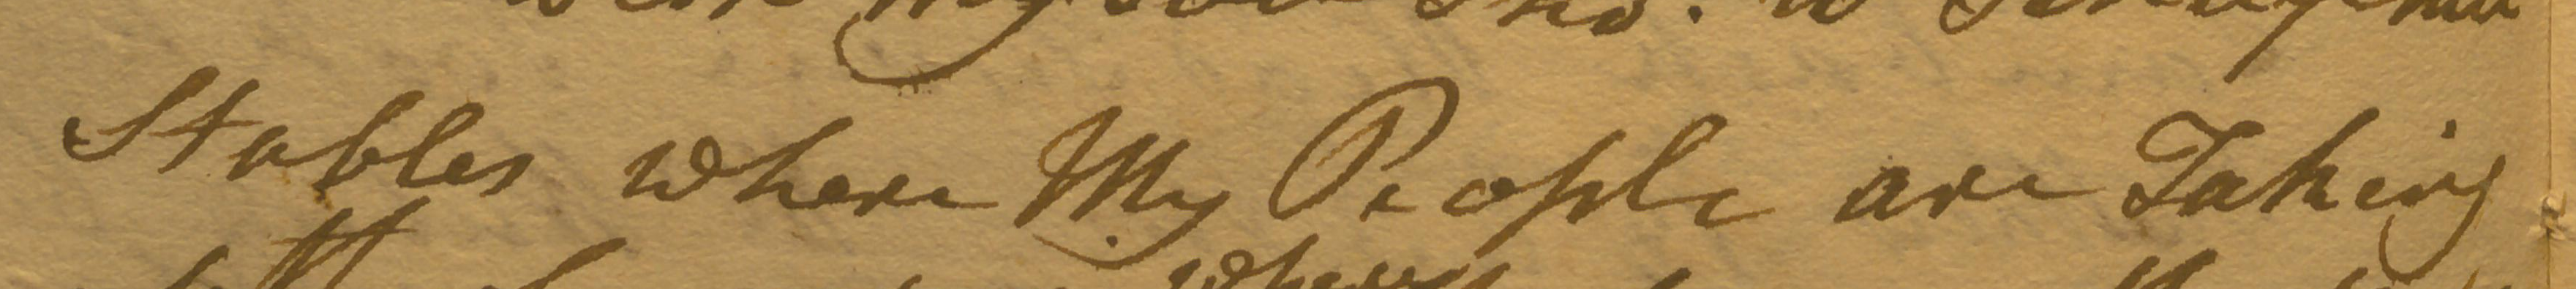Stables where My People are Taking
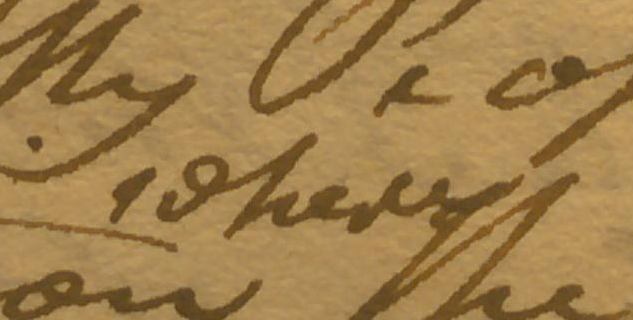to here
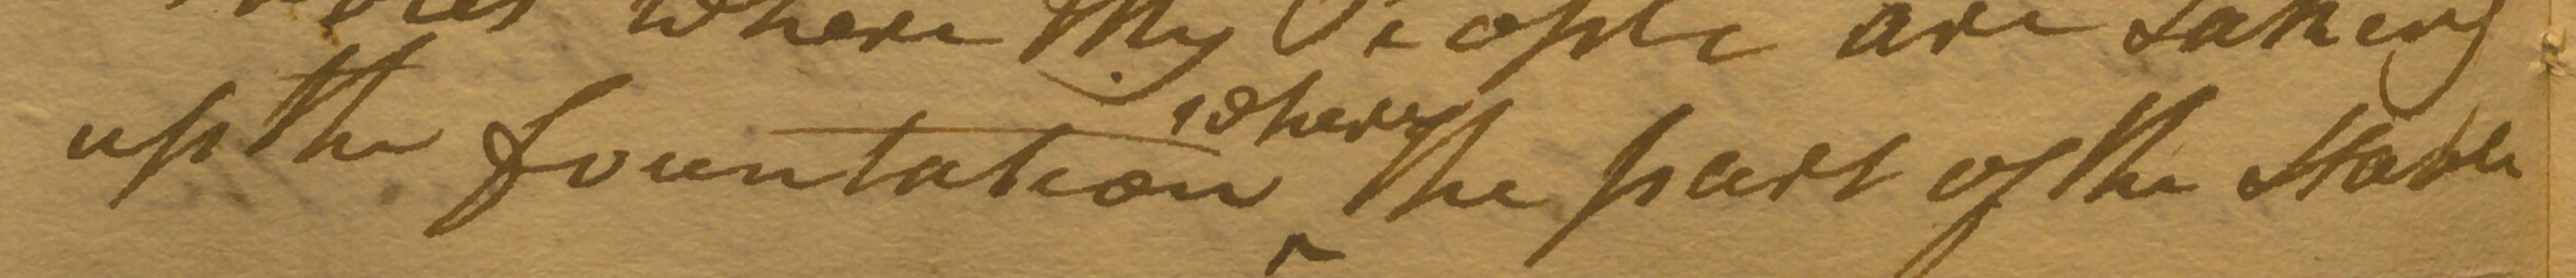up the fountation ^ the part of the Stable
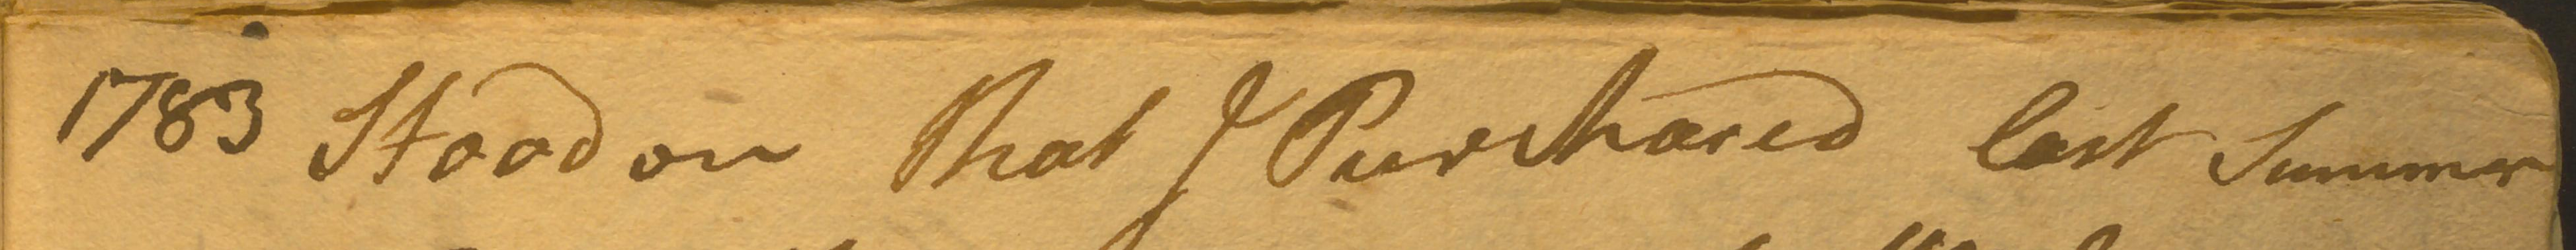1783 Stood on that I Purchased last Summer
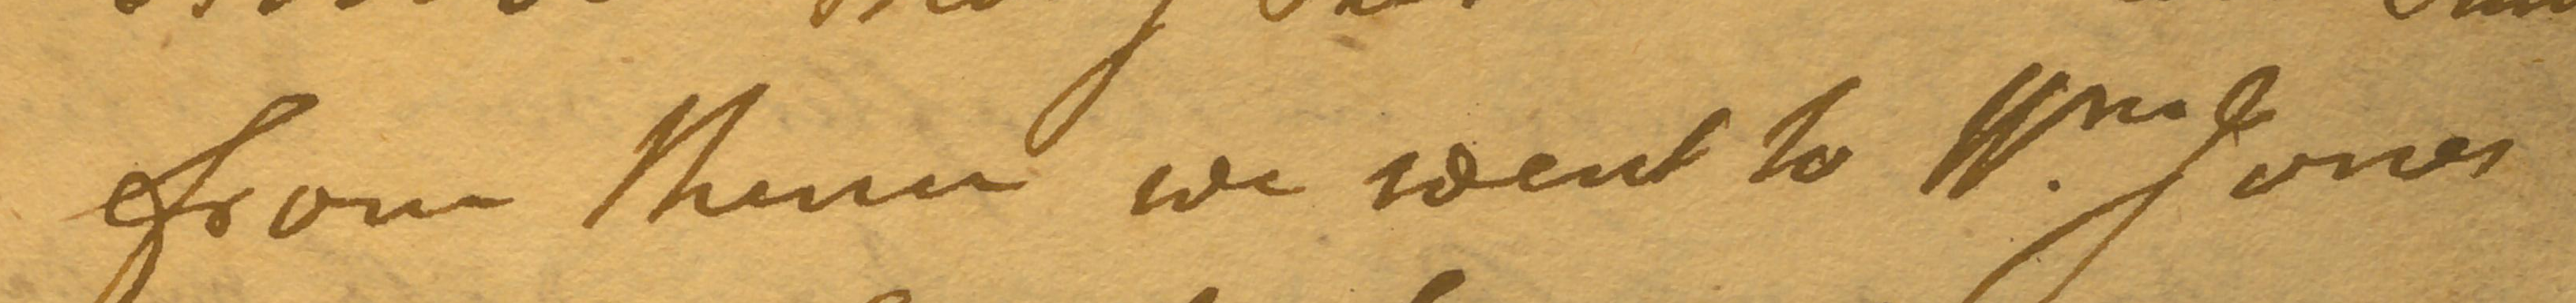fron thence we went to W^m. Jones
